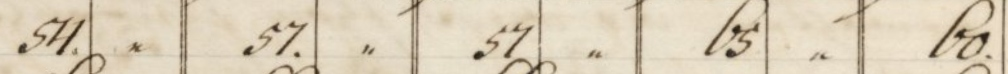54. ,, 57. ,, 57. ,, 65. ,, 60.
